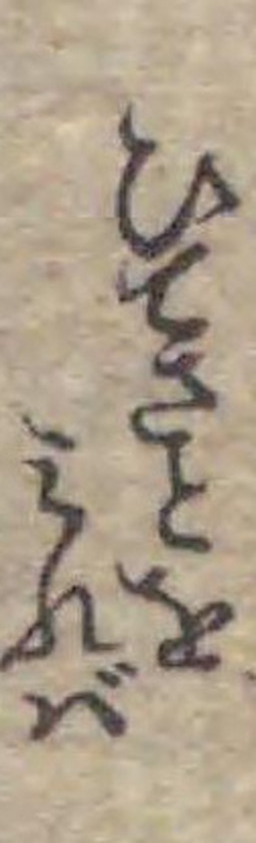みれば
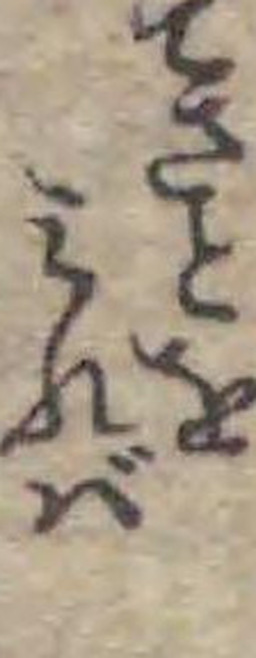みれば
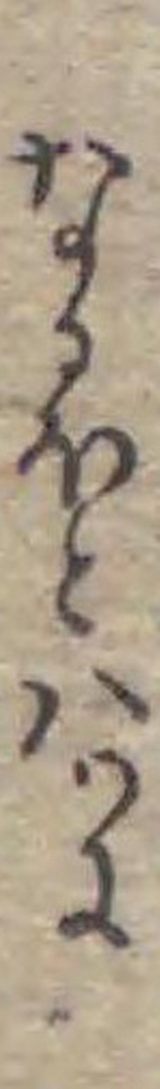なるほと八つに
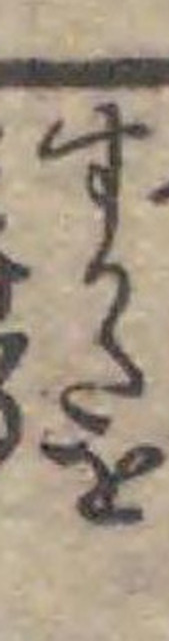すかたを
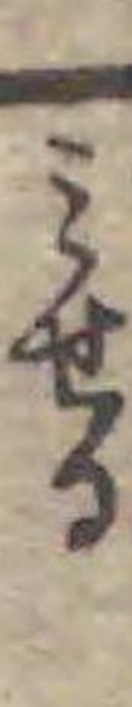みせる
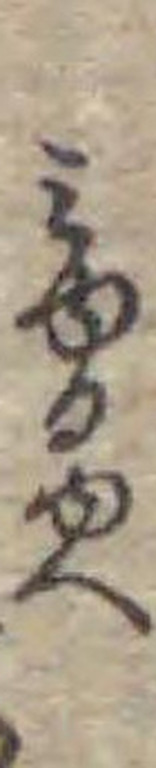みゆるゆへ
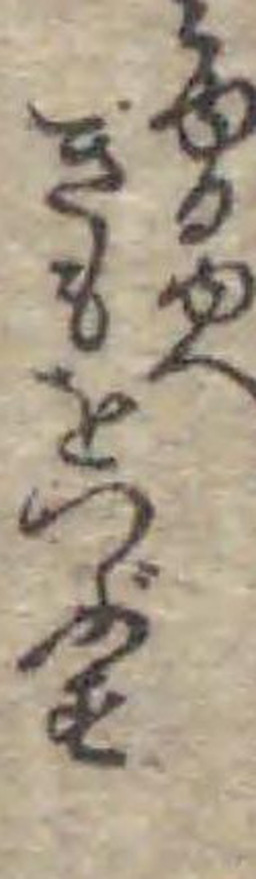きもをつぶす
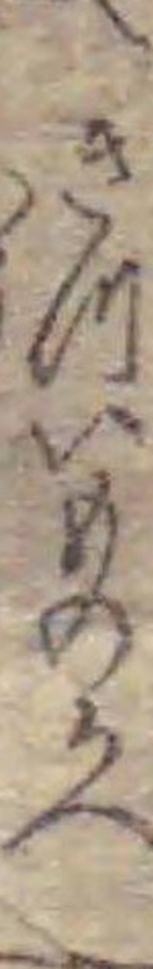きついものかへ
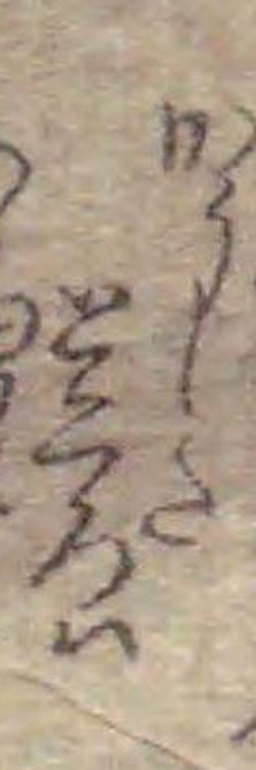ところは
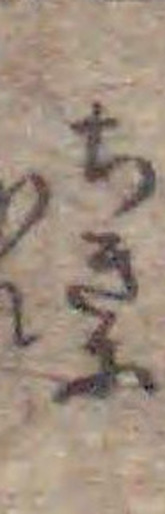ちきに

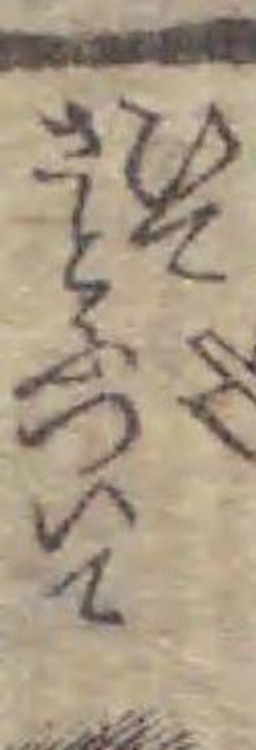さとについて
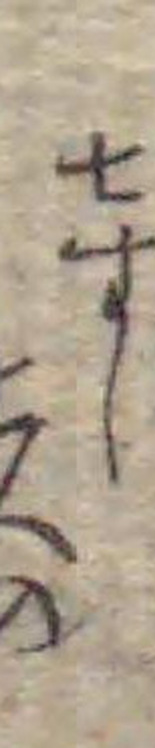七人の
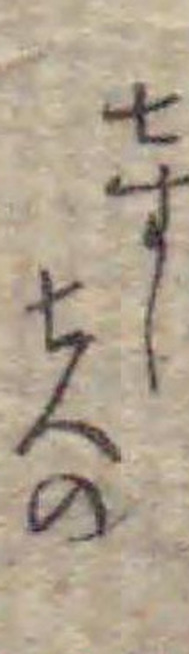七人の
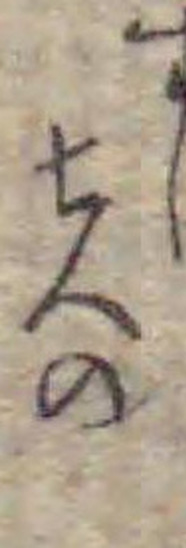七人の

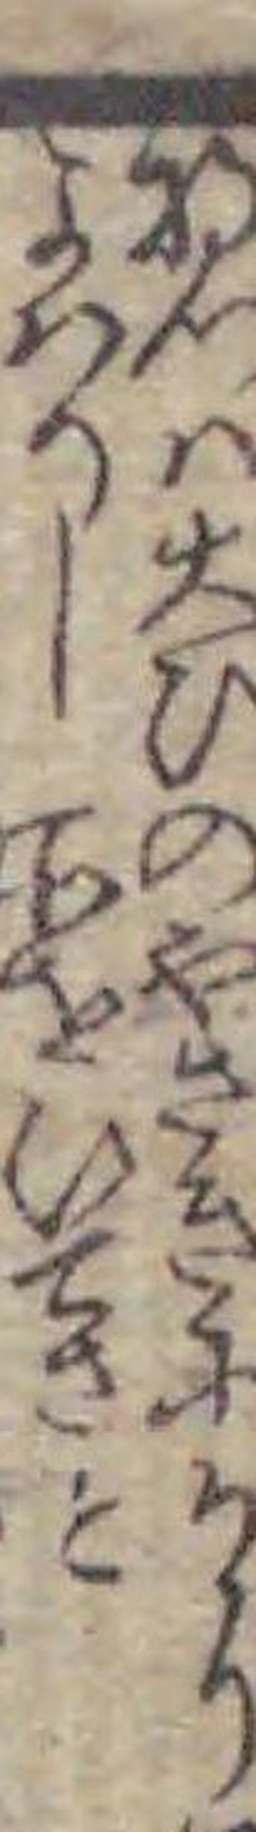よはりし所をひてさと
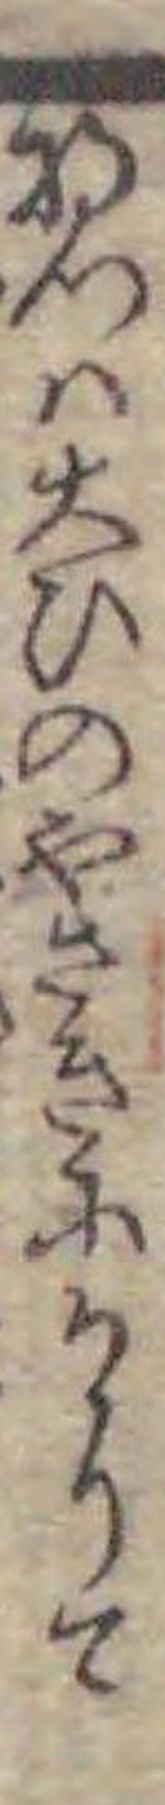将門は大ひのやさきにかゝりて
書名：時代世話二挺皷 : 2巻
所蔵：国立国会図書館 National Diet Library, JAPAN
